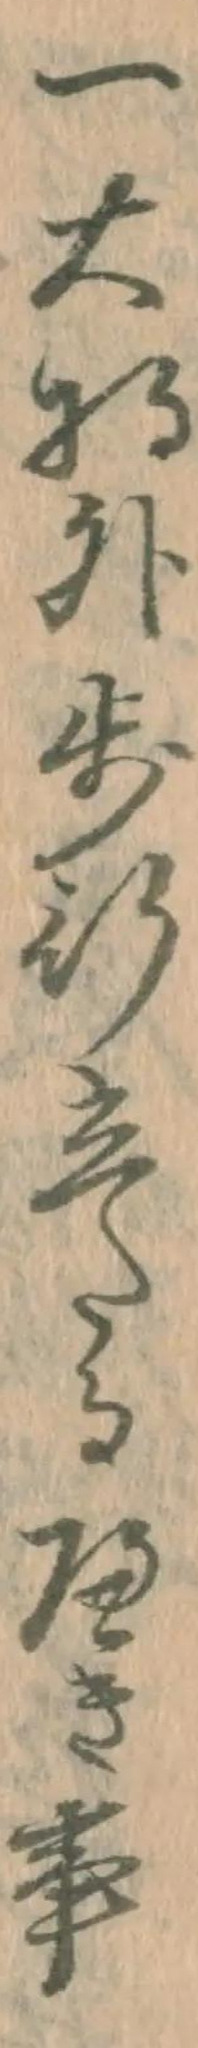一大将外歩行立たる扁き事
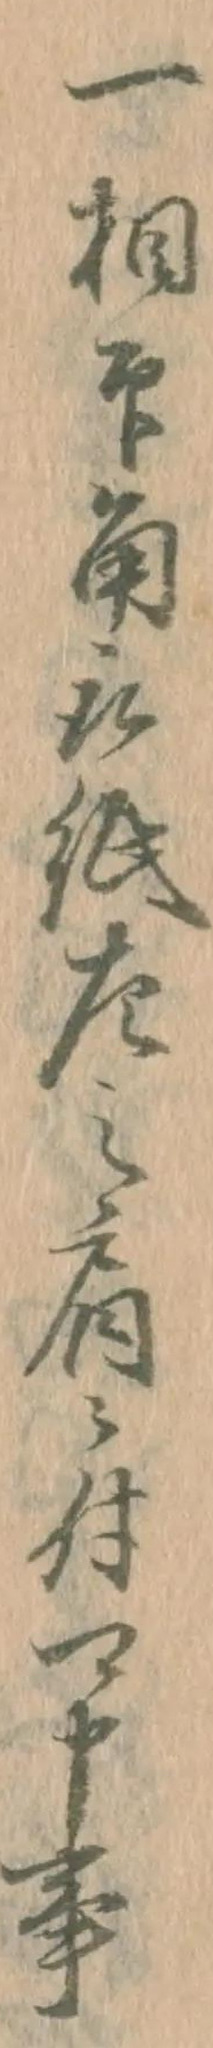一相印角取紙左之肩に付可申事
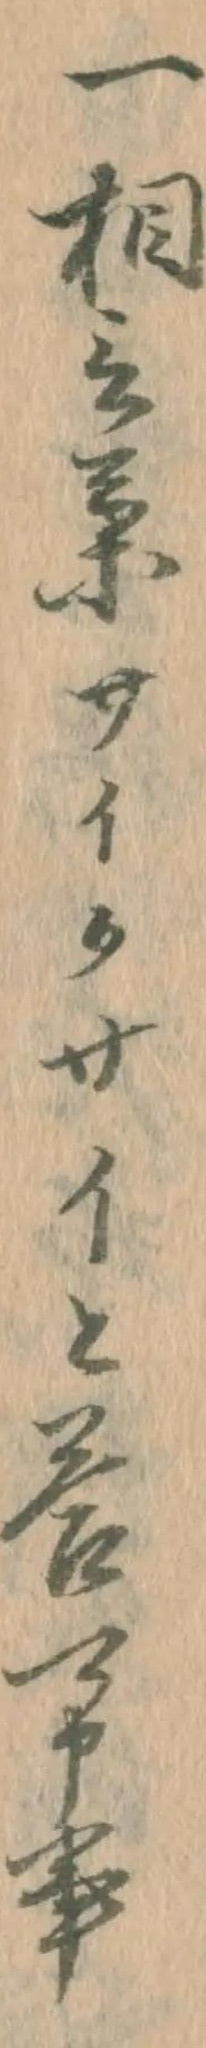一相言葉さいたさいと答可申事
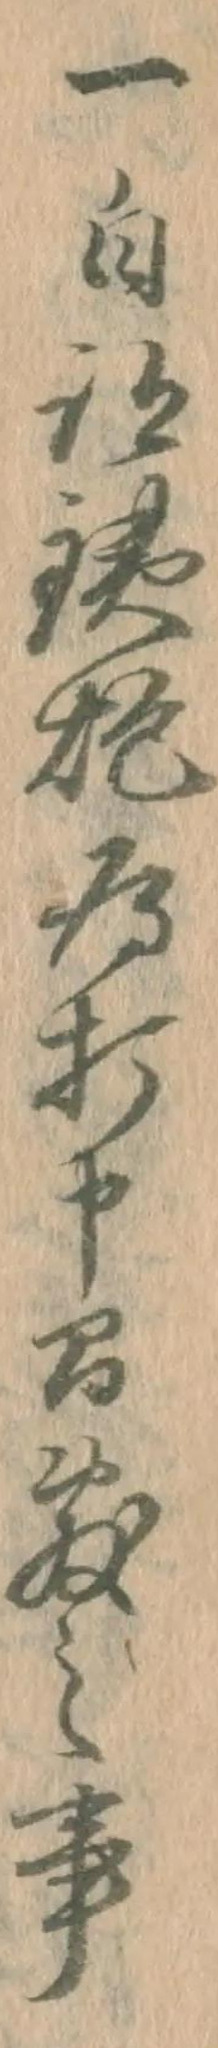一自跡鉄炮為打申間敷之事
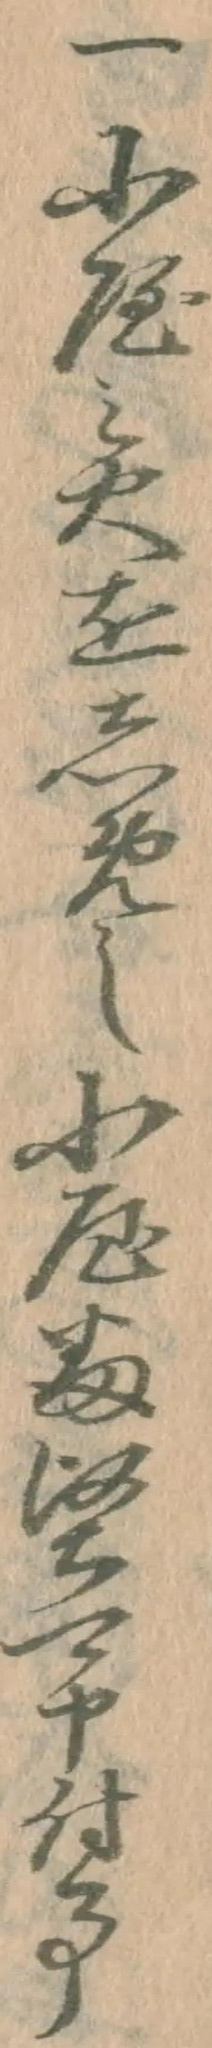一小屋之火を士志免し小屋番堅可申付事
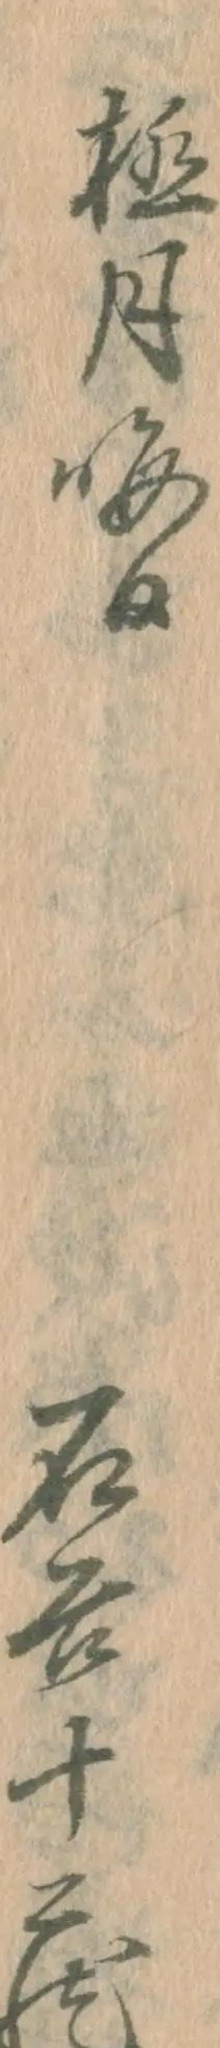極月晦日石谷十蔵
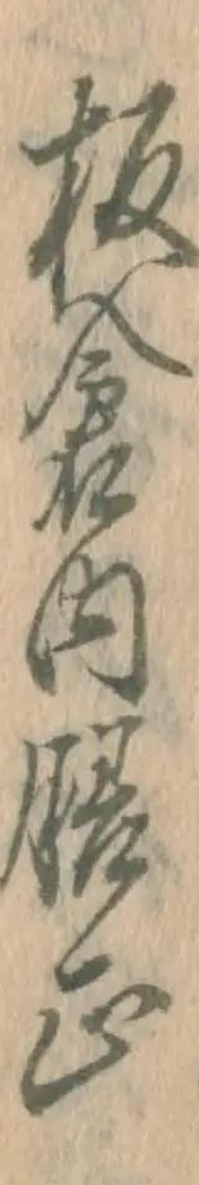板倉内膳正
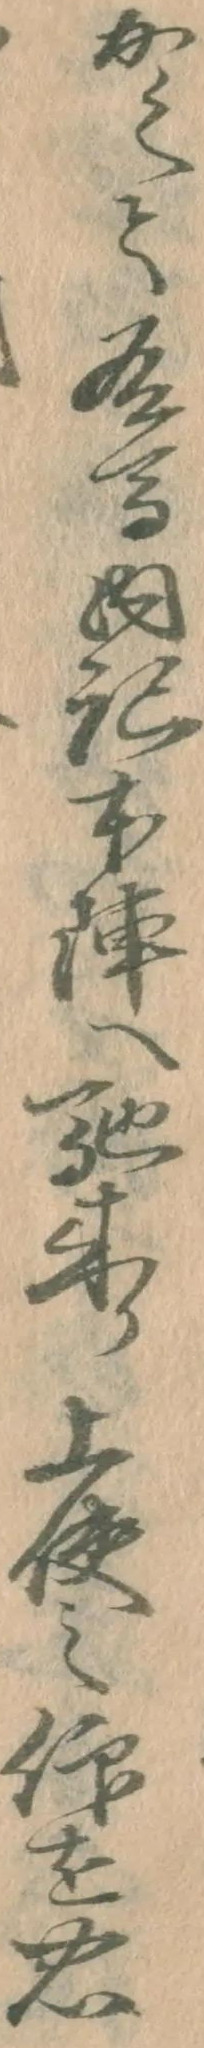かくて有馬内記本陣へ馳来り上使之仰を忠
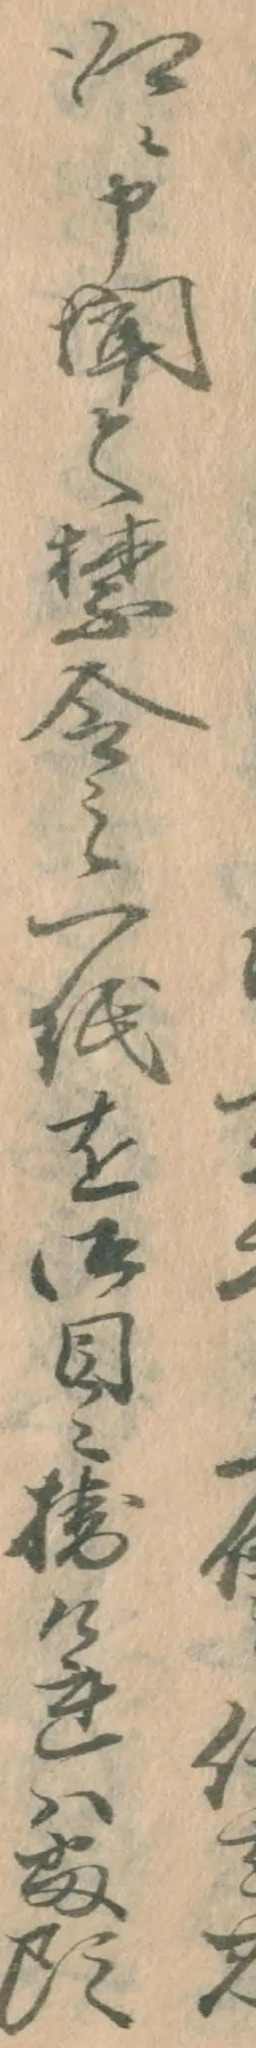郷に申聞て禁令之一紙を御目に掛け連は番頭
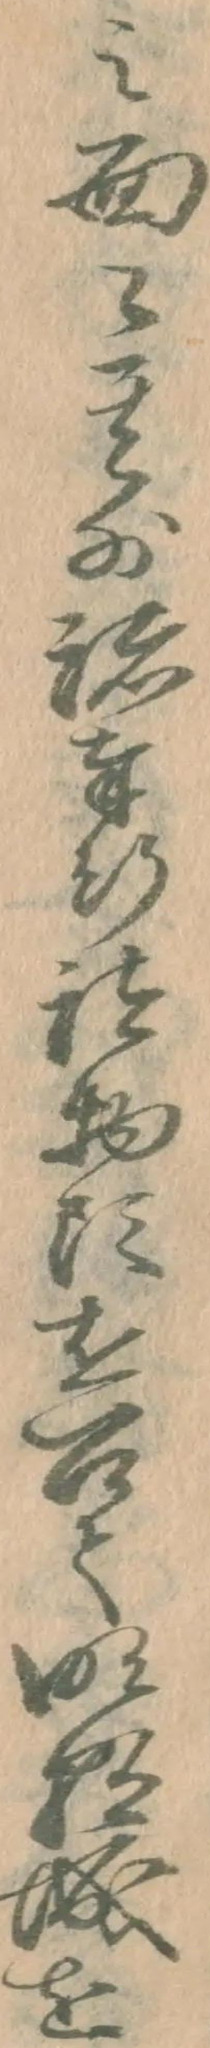之面々其外諸奉行諸物頭を召て明朝城を

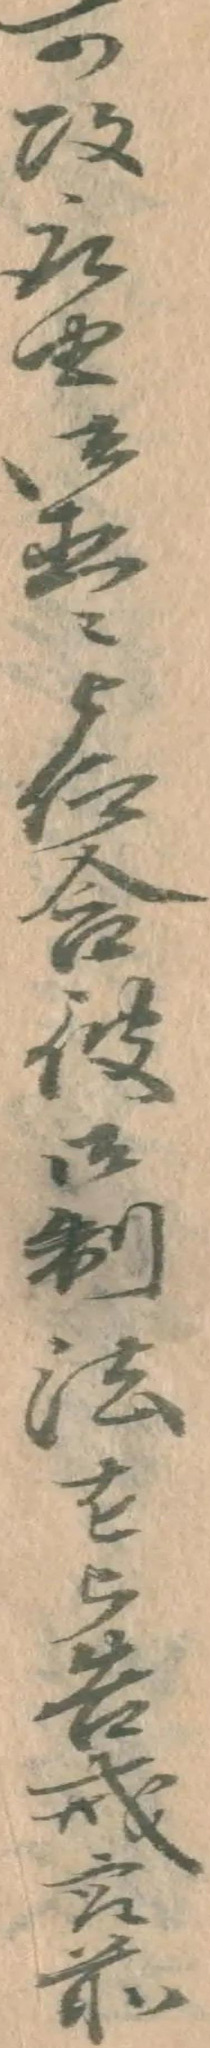可攻取由御直に被仰合彼御制法を被告戒最前
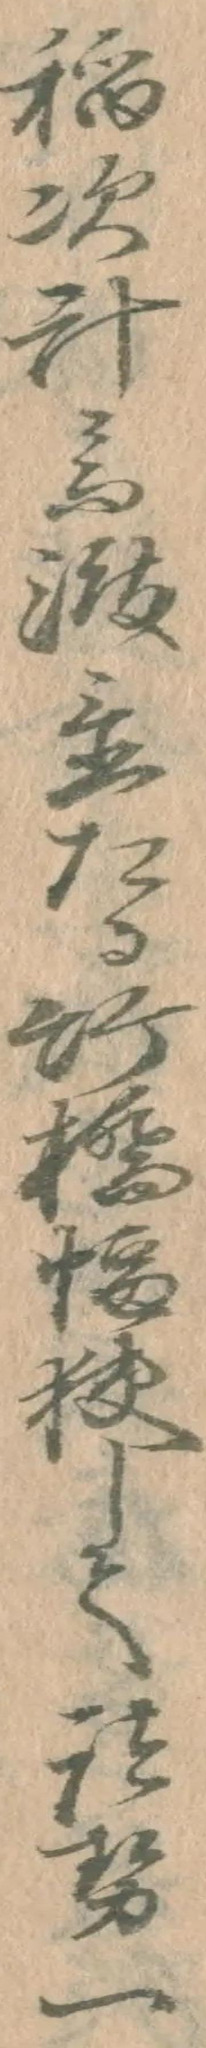稲次計に而渡置たる竹橋幅狭して諸勢一
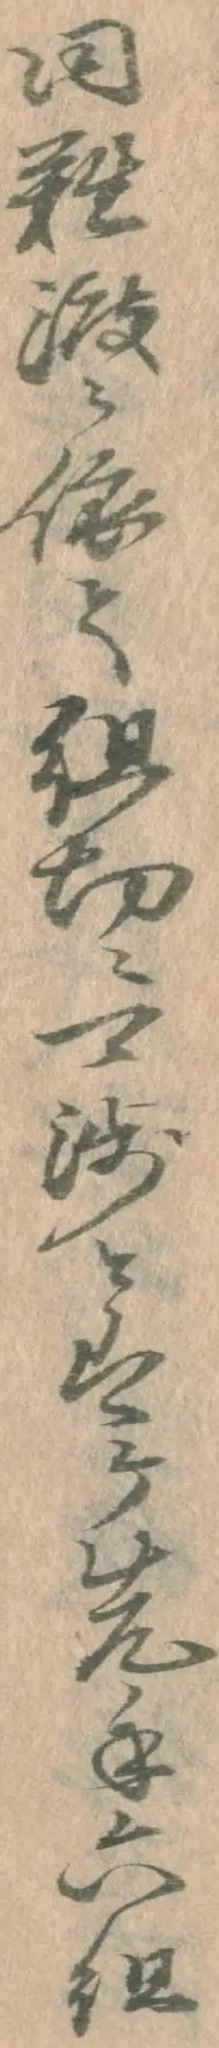同難渡に依て組切に可渉と届け先手六組
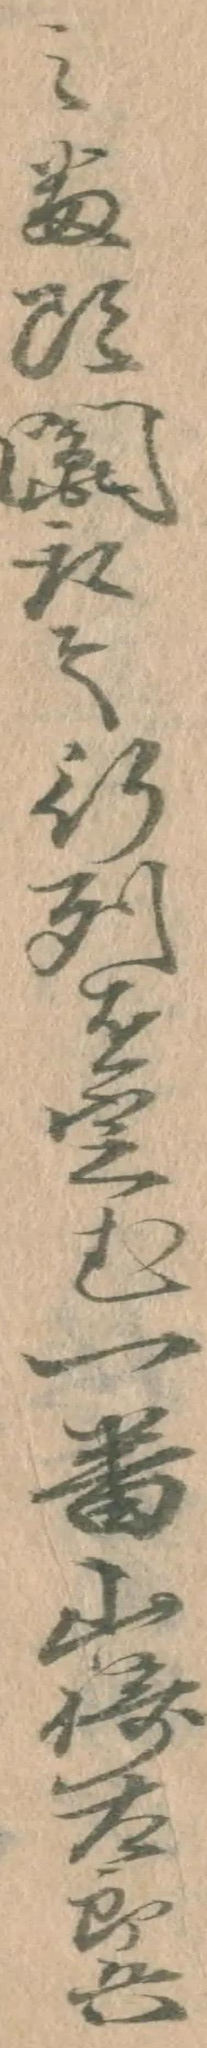之番頭鬮取て行列を定む一番山崎太郎兵
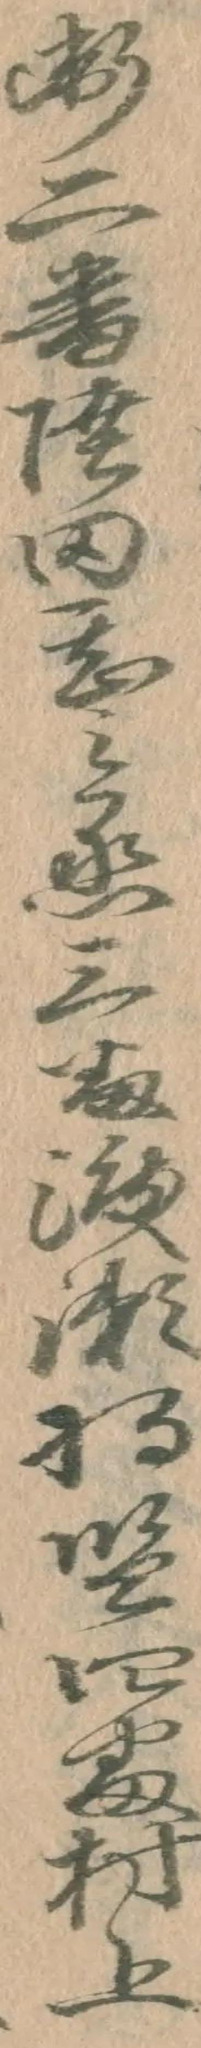衛二番陸田甚之丞三番渡瀬将監四番村上
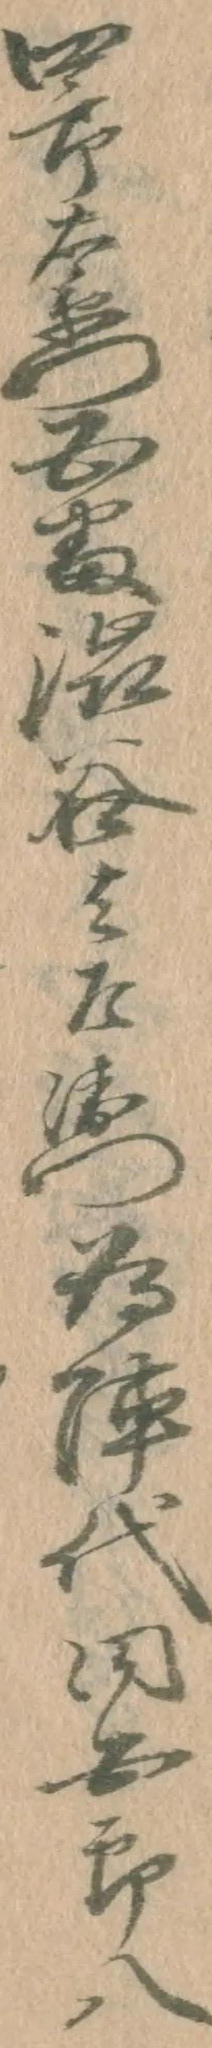四郎右衛門五番渋谷与左衛門為陣代同五郎八
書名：切支丹御退治記 49巻. [5]
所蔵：国立国会図書館 National Diet Library, JAPAN
